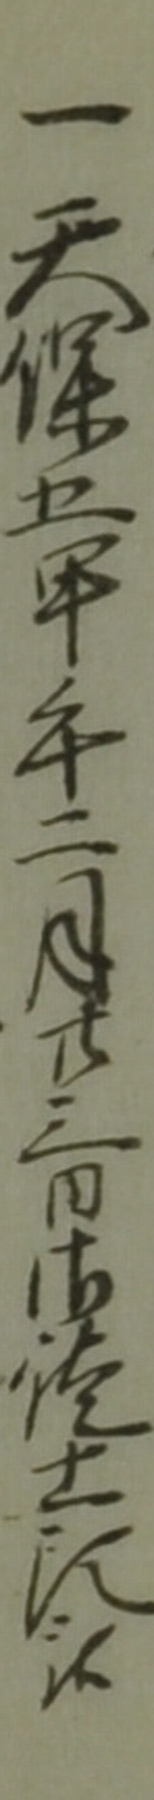一天保五甲午二月廿三日御徒士頭被被
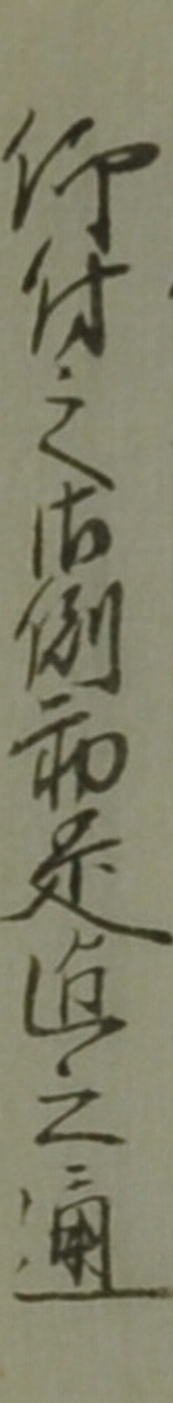仰付之御側勤是迄之通
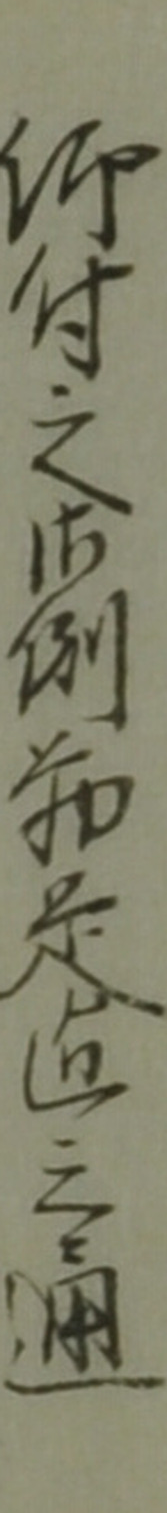仰付之御側勤是迄之通
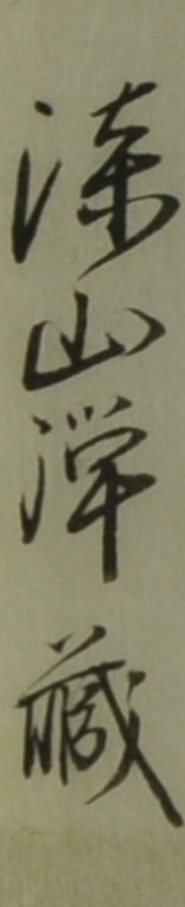漆山弾蔵

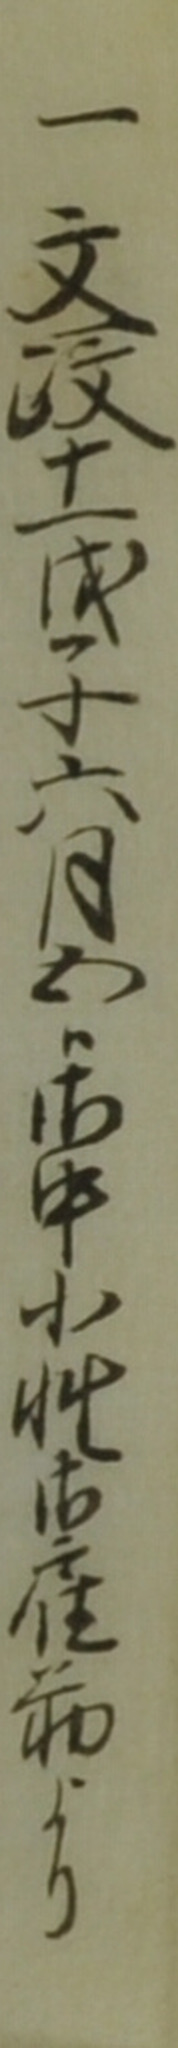一文政十一戊子六月五日御中小姓御雇勤より
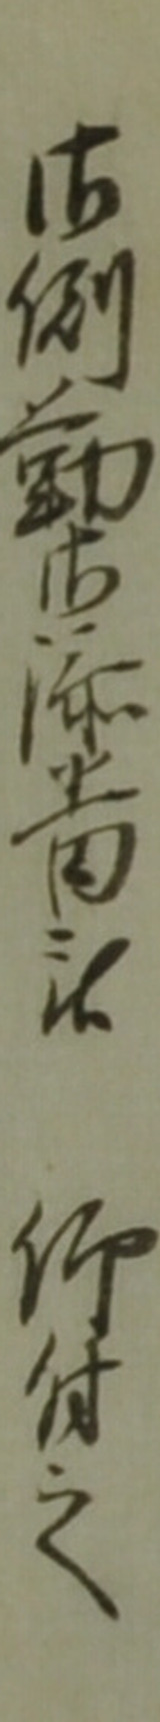御側勤御添番被仰付之
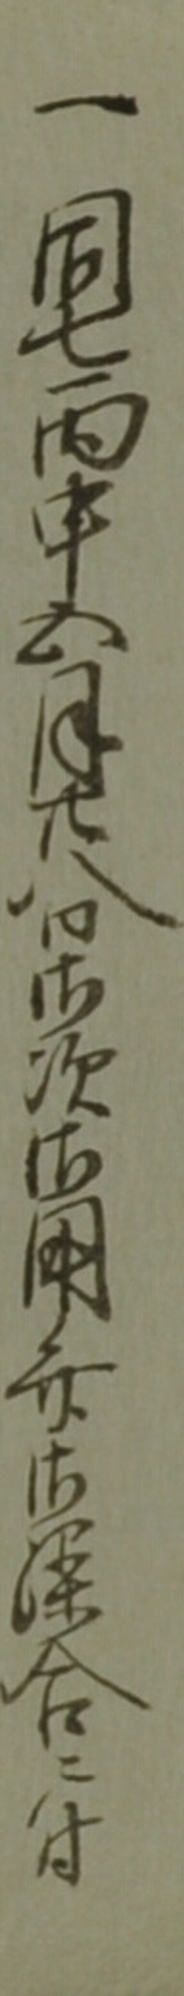一同七丙申五月廿八日御次御用弁御繰合に付
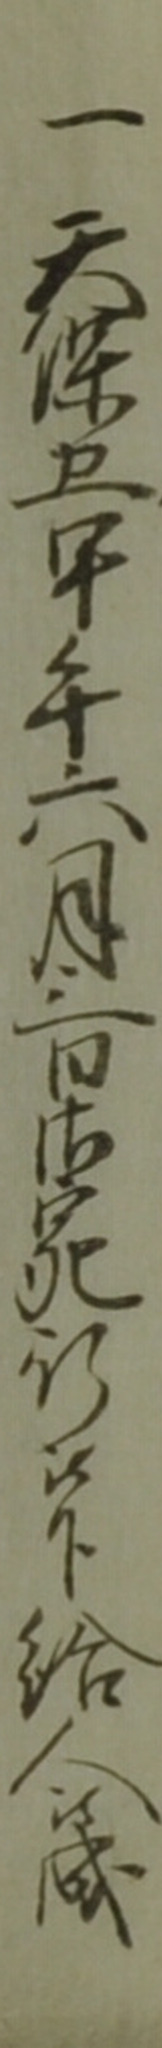一天保五年甲午六月三日御宛行被下給人被成
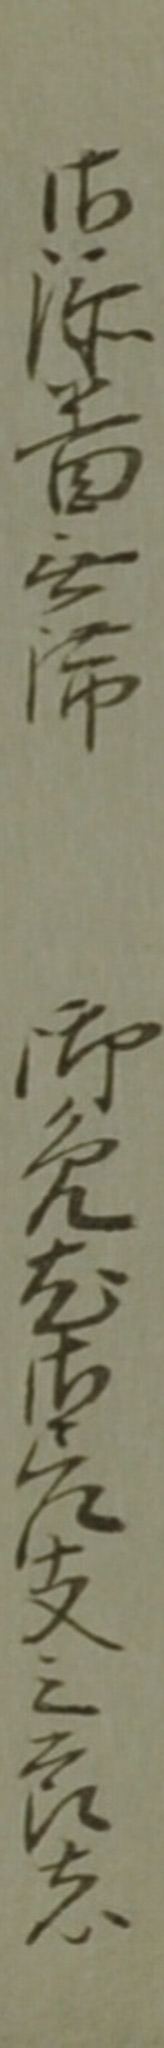御添番無滞御免尤御差支之節は
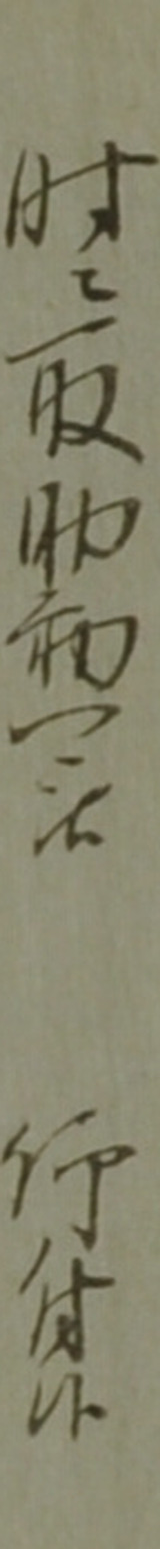時に取助勤可被仰付候
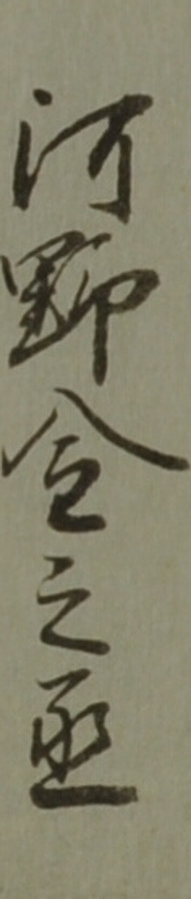河野金之丞
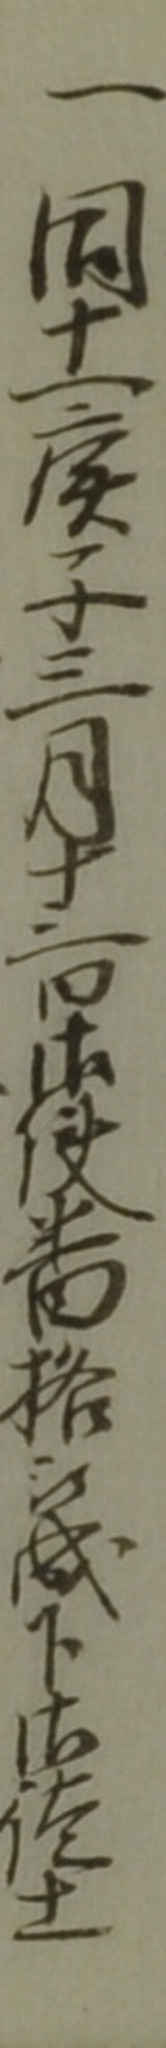一同十一庚子三月十三日御使番格被成下御徒士
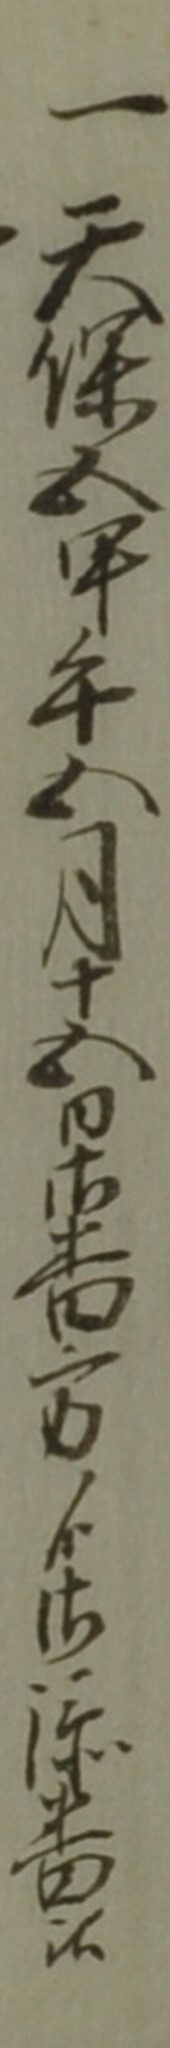一天保五甲午五月十五日御番方より御添番被
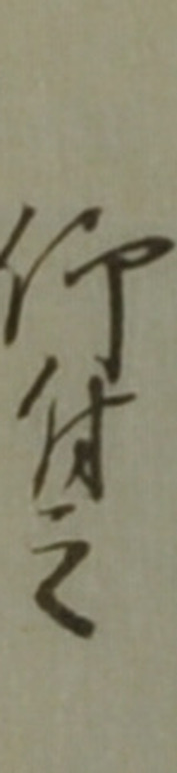仰付之
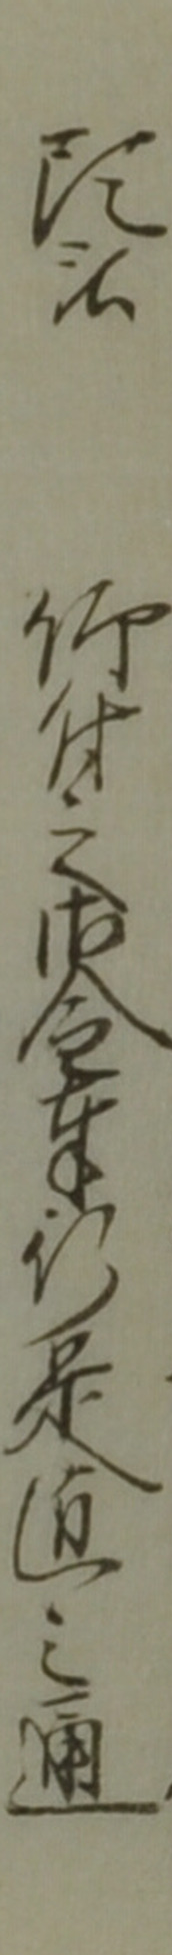頭被仰付之御金奉行是迄之通
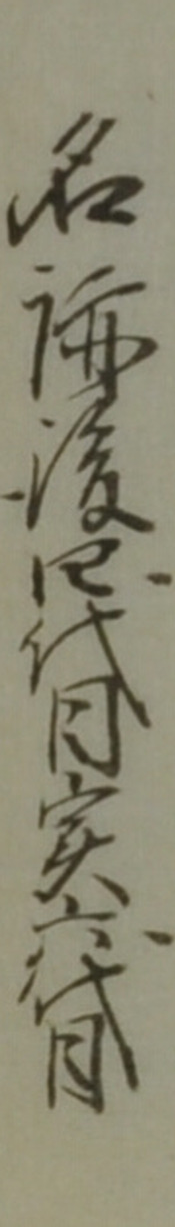名跡後四代目実六代目
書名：諸御役代々録（八）
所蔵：伊那市立高遠町図書館・合同会社AMANE
